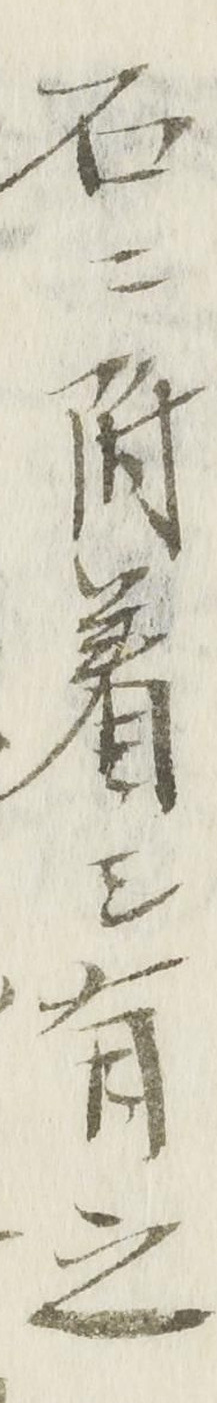石ニ附着シ有之
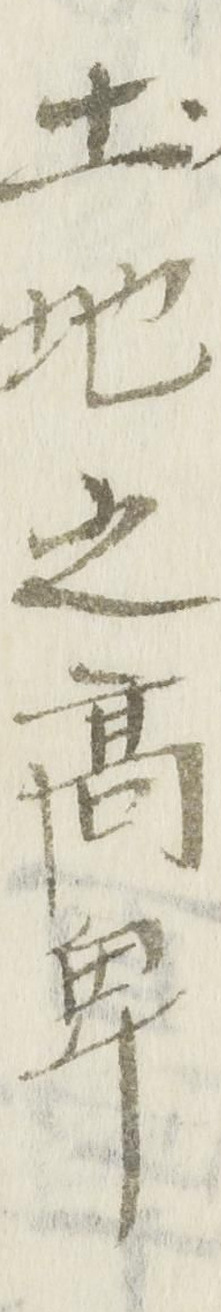土地之高卑
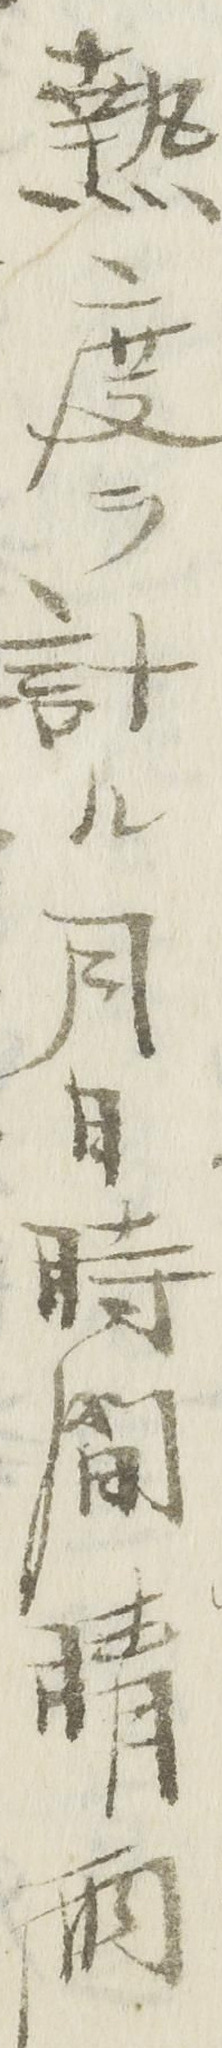熱度を計る月日時間晴雨
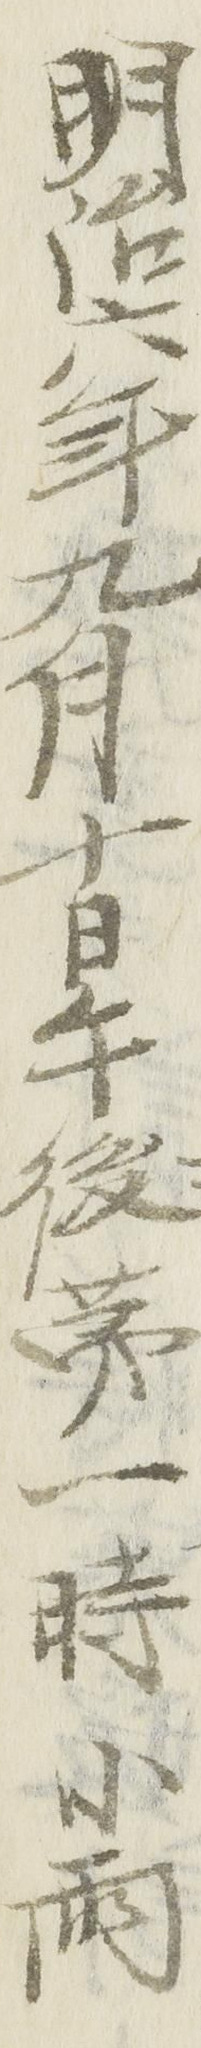明治六年九月十日午後第一時小雨

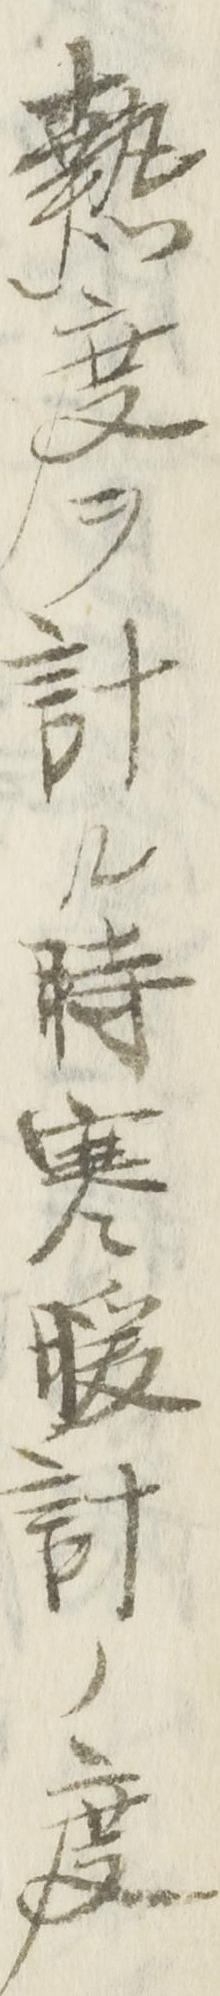熱度ヲ計ル時寒暖計ノ度
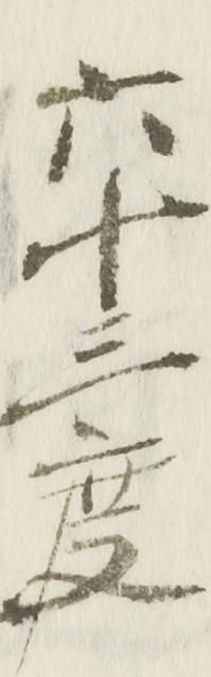六十三度
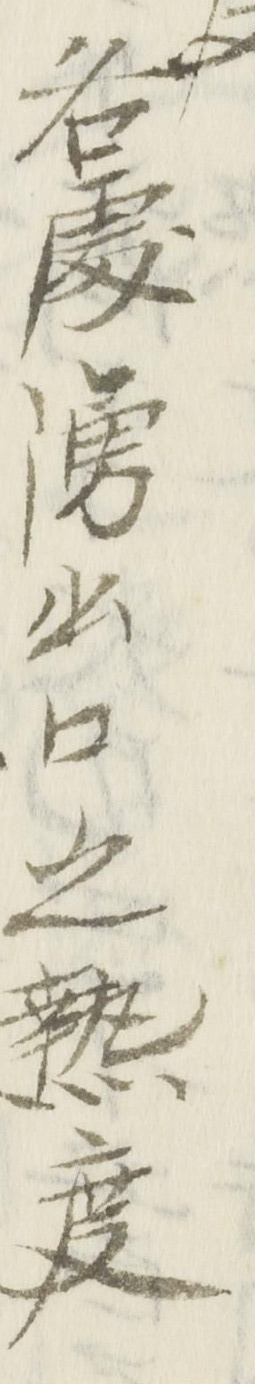各處湧出口之熱度
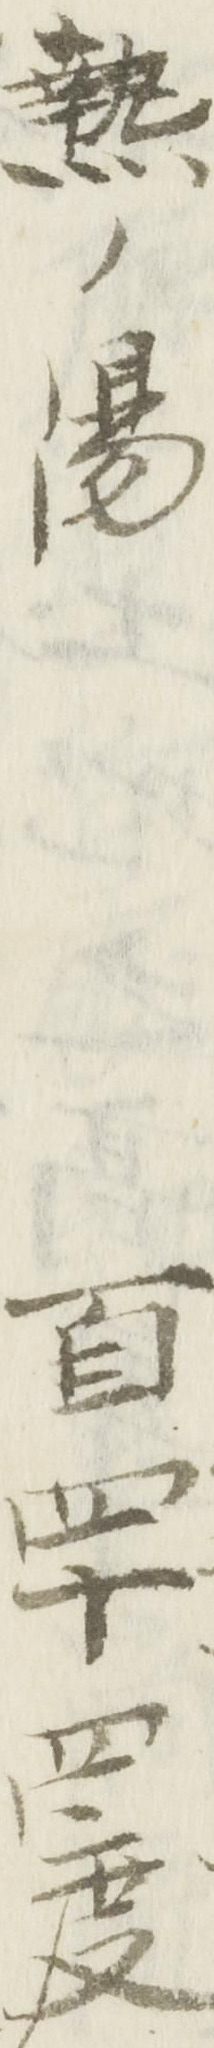熱ノ湯百四十四度
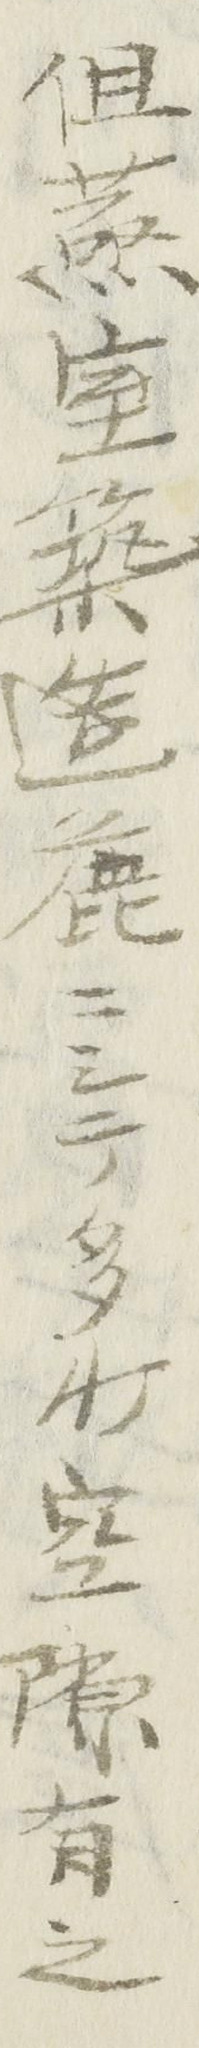但蒸室築造麁ニシテ多少空隙有也
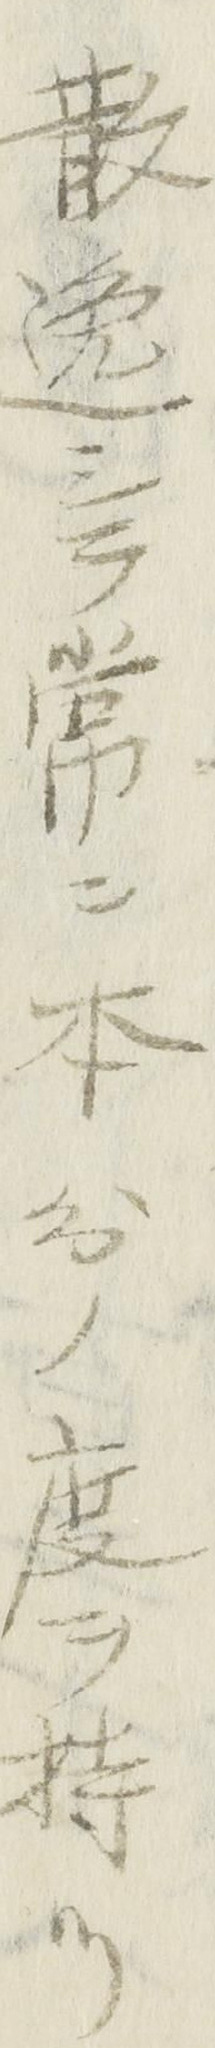散逸シテ常ニ本分ノ度ヲ持ツ

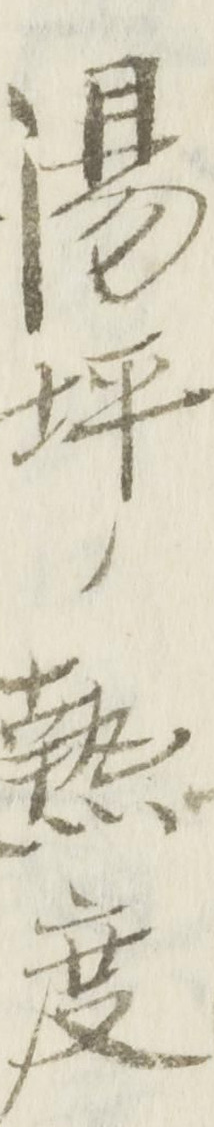湯坪ノ熱度
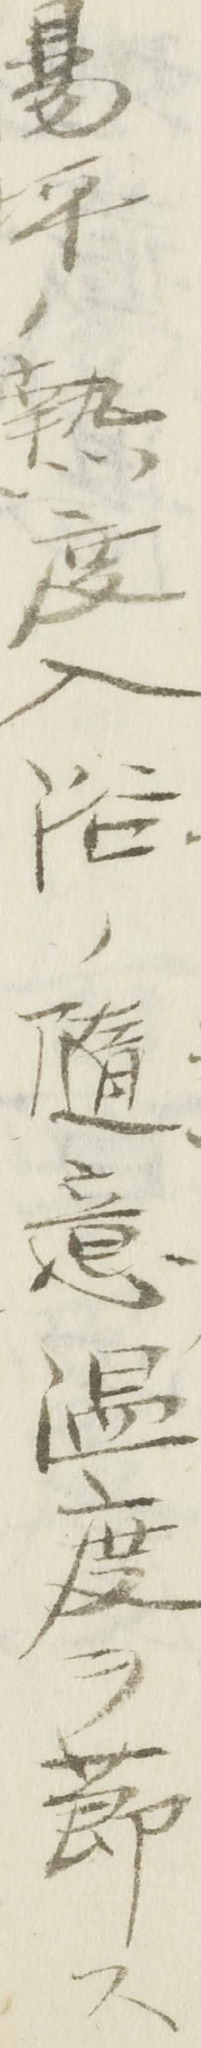湯坪ノ熱度入浴ノ随意温度を節ス
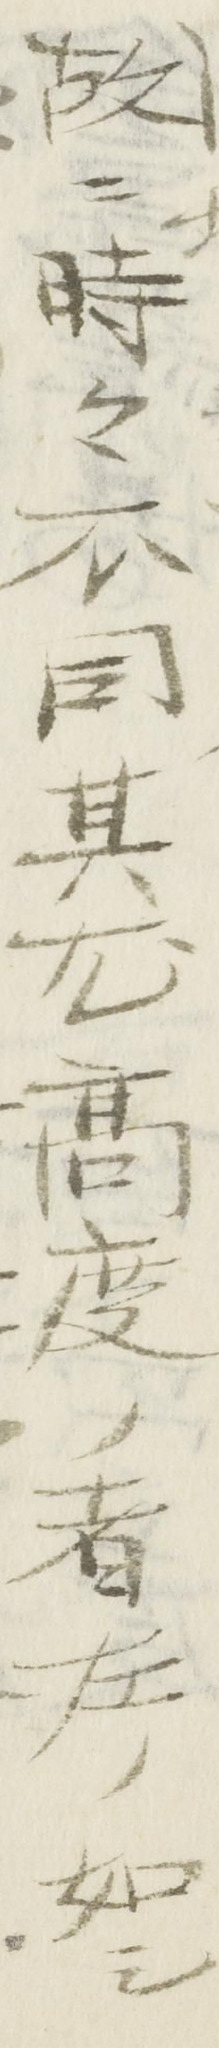故ニ時々不同其尤高度ノ者左ノ如シ
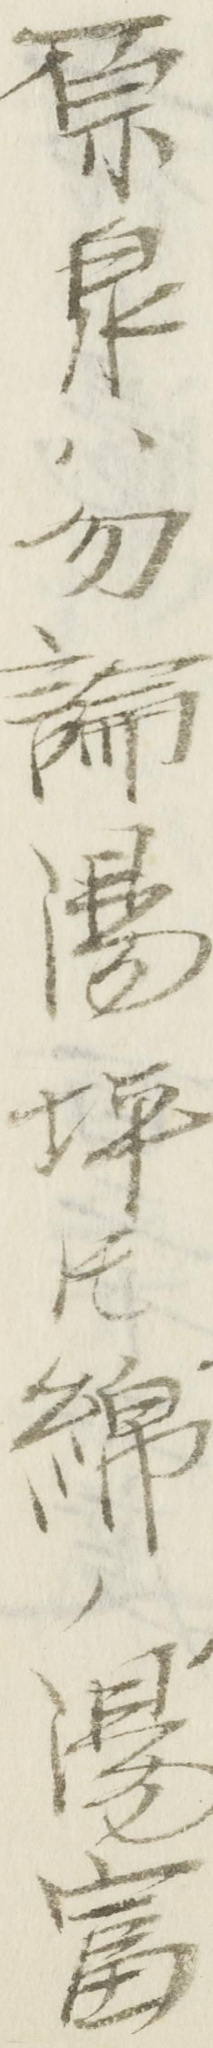原泉ハ勿論湯坪トモ綿ノ湯富
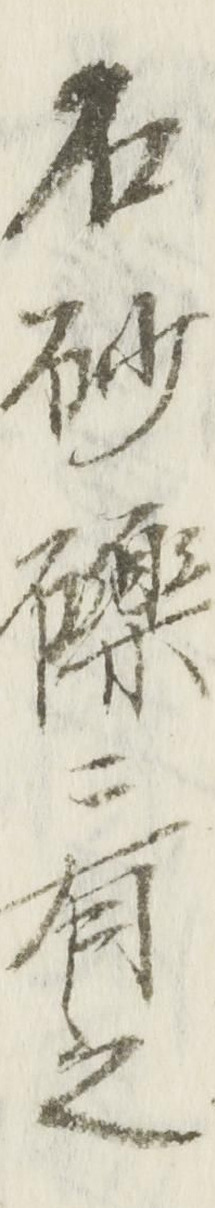石砂礫ニ有之
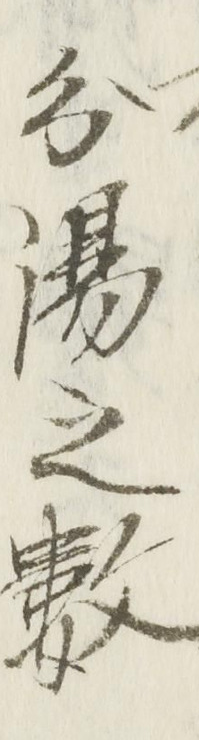分湯之数
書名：温冷泉試験表
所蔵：東京大学地震研究所図書室 Earthquake Research Institute Library, The University of Tokyo, JAPAN
